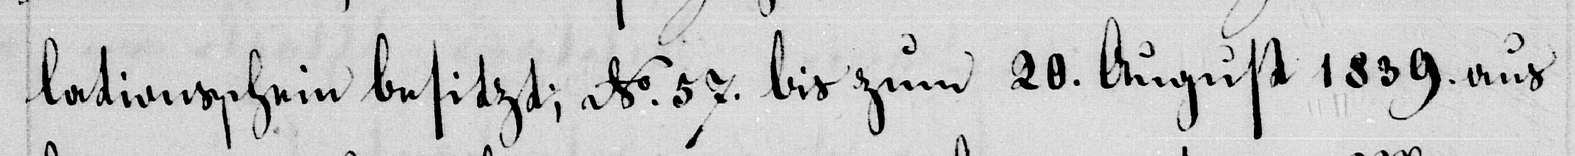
lationsschein besitzt; No. 57. bis zum 20. August 1839. aus
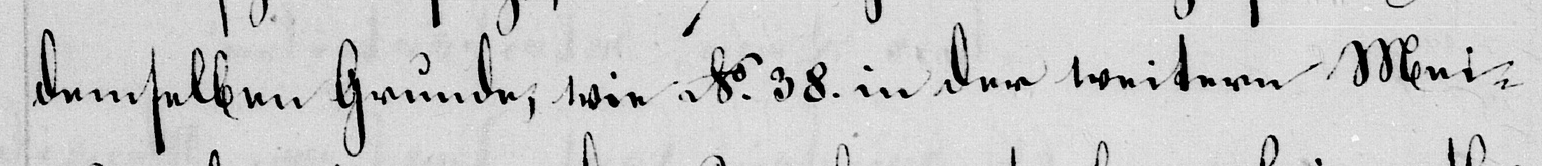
demselben Grunde, wie No. 38. in der weitern Mei¬
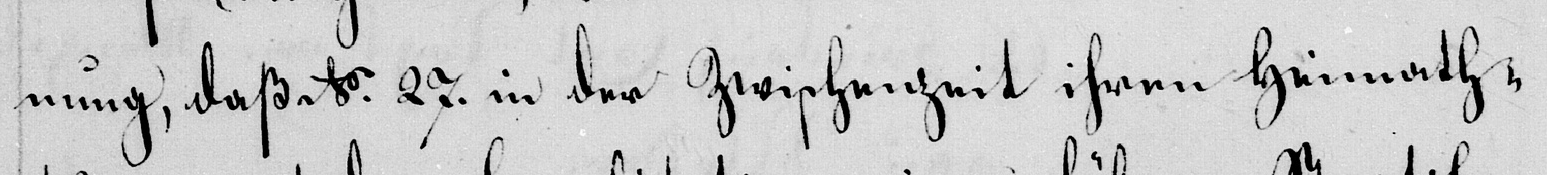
nung, daß No. 27. in der Zwischenzeit ihren Heimath¬
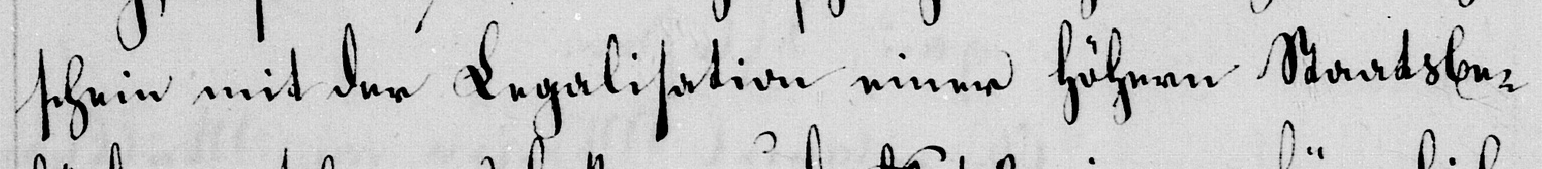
schein mit der Legalisation einer höhern Staatsbe¬
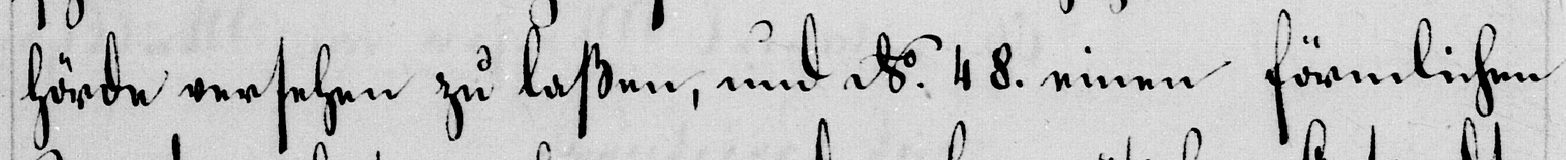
hörde versehen zu laßen, und No. 48. einen förmlichen
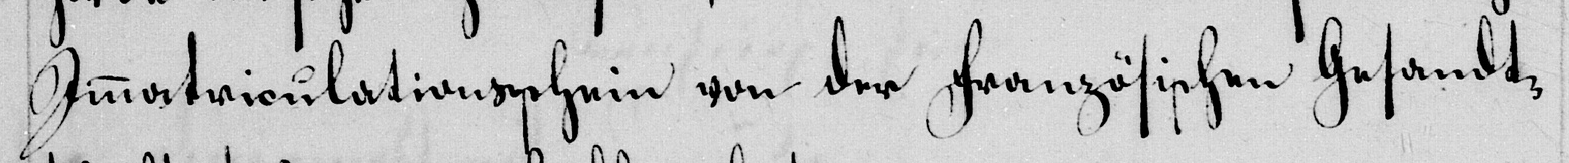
Immatriculationsschein von der französischen Gesandt¬
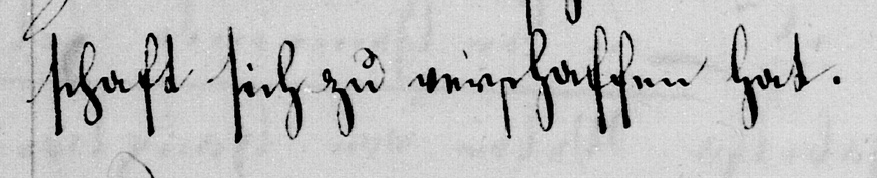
schaft sich zu verschaffen hat.
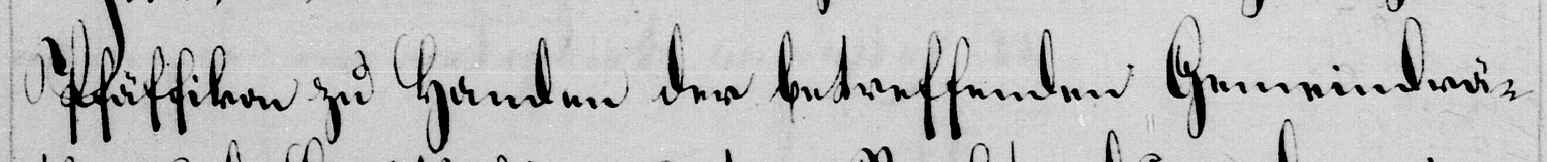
Pfäffikon zu Handen der betreffenden Gemeindrä¬
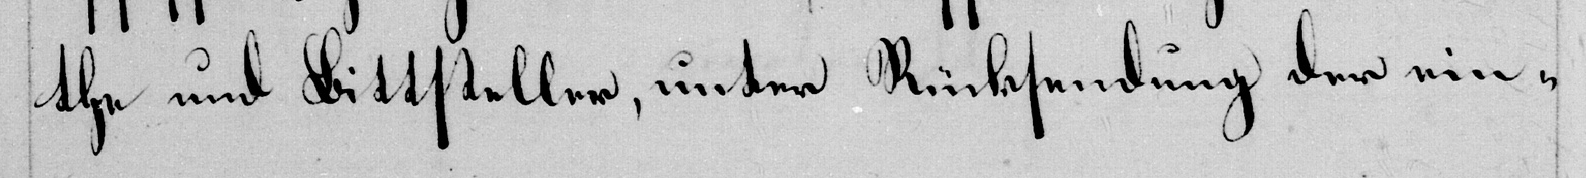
the und Bittsteller, unter Rücksendung der ein-
